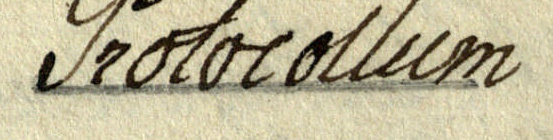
Protocollum
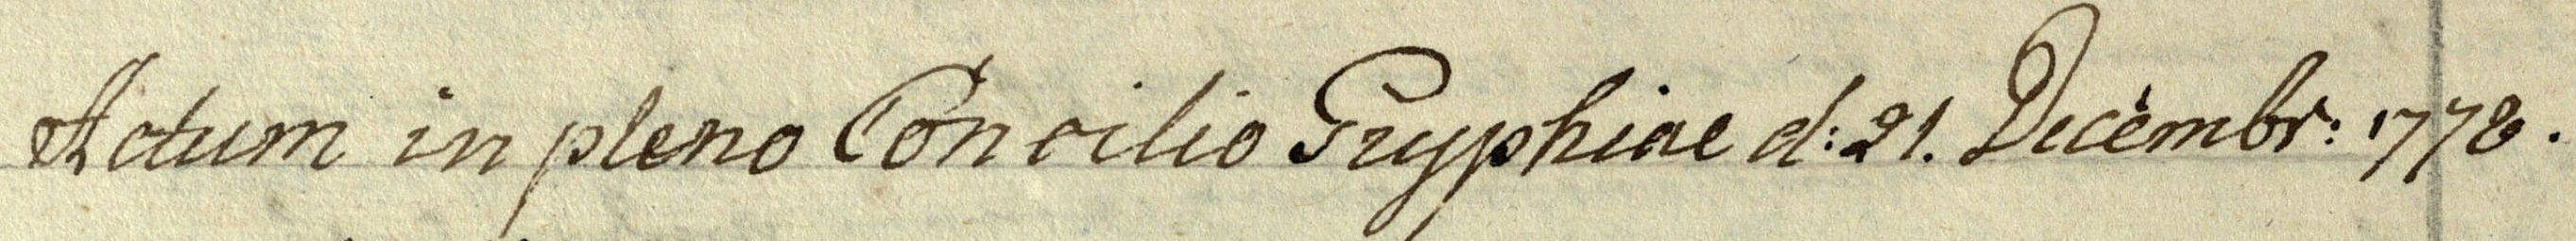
Actum in pleno Concilio Gryphiae d. 21. Decembr. 1778.
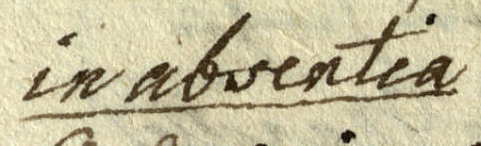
in absentia
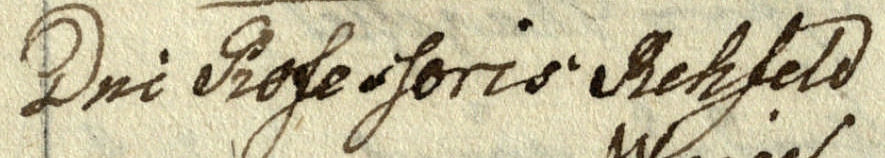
Dn Professoris Rehfeld
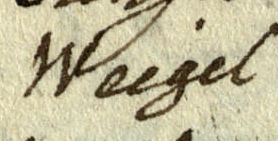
Weigel
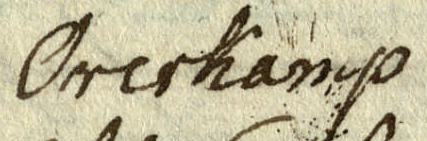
Overkamp
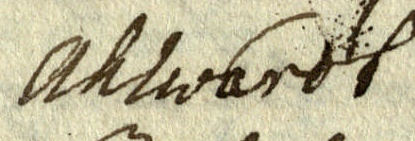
Ahlwardt
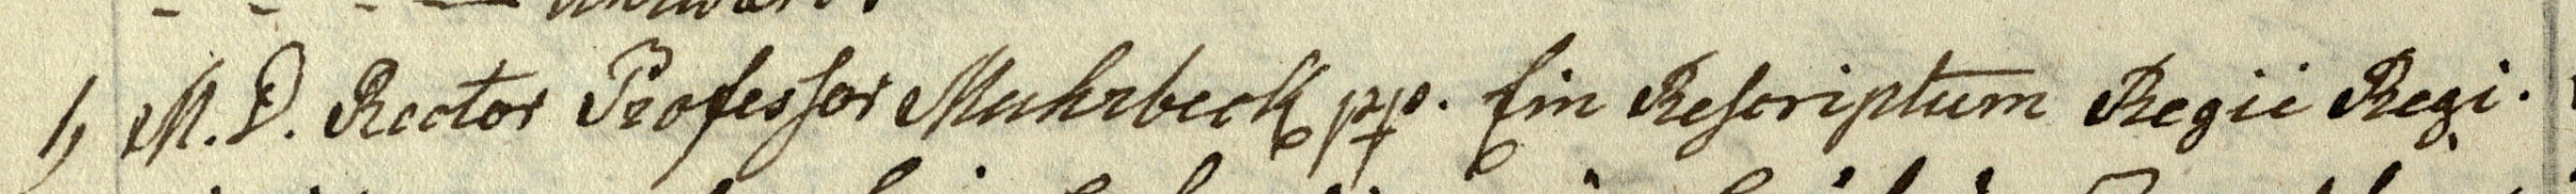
1, M. D. Rector Professor Muhrbeck pp. Ein Rescriptum Regii Re¬
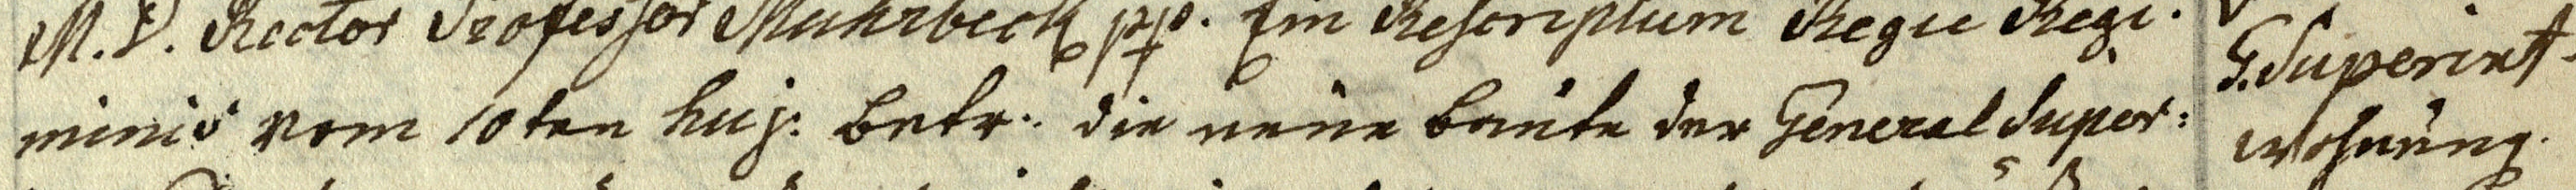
giminis vom 10. huj. betr. die eine Baute der General Super¬
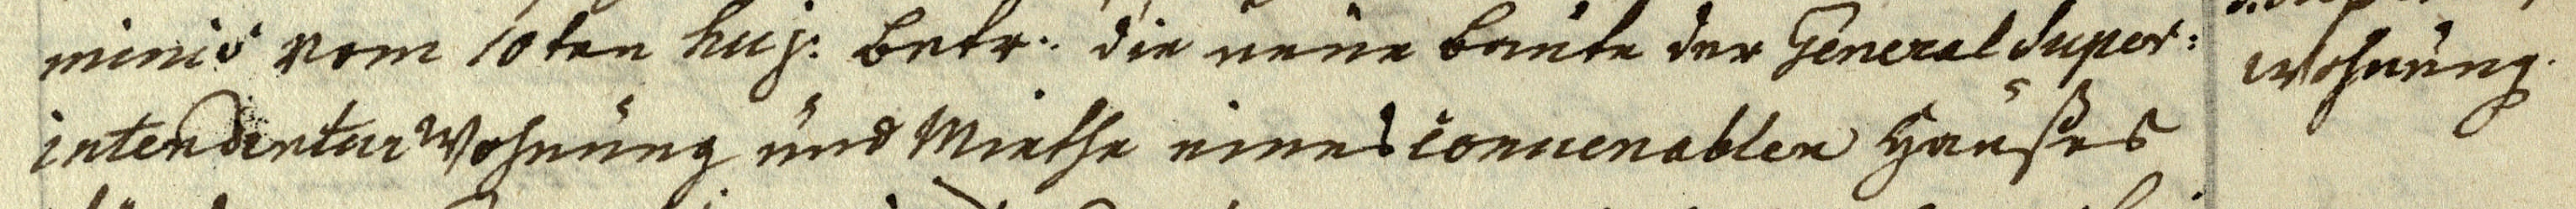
intendentur Wohnung und Miethe eines convenablen Hauses
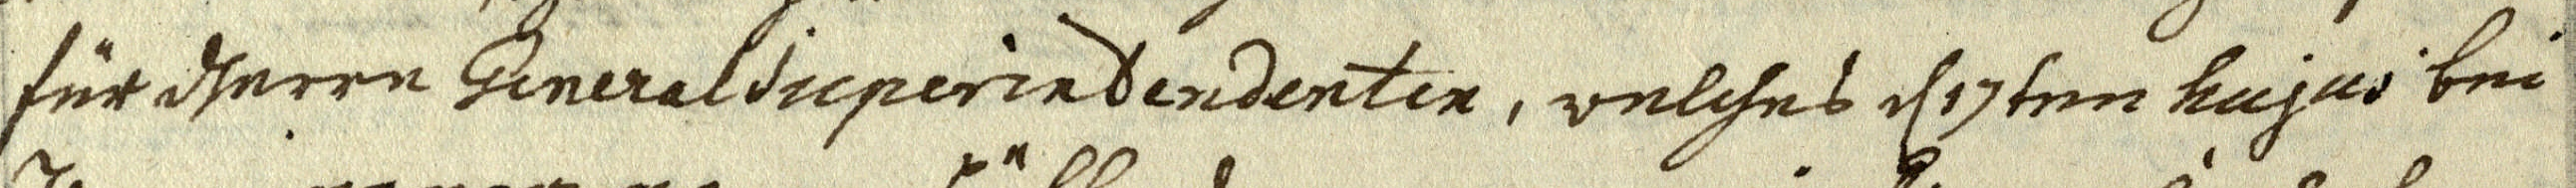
für dherrn GeneralSuperintendenten, welches d. 17 ten hujus bei
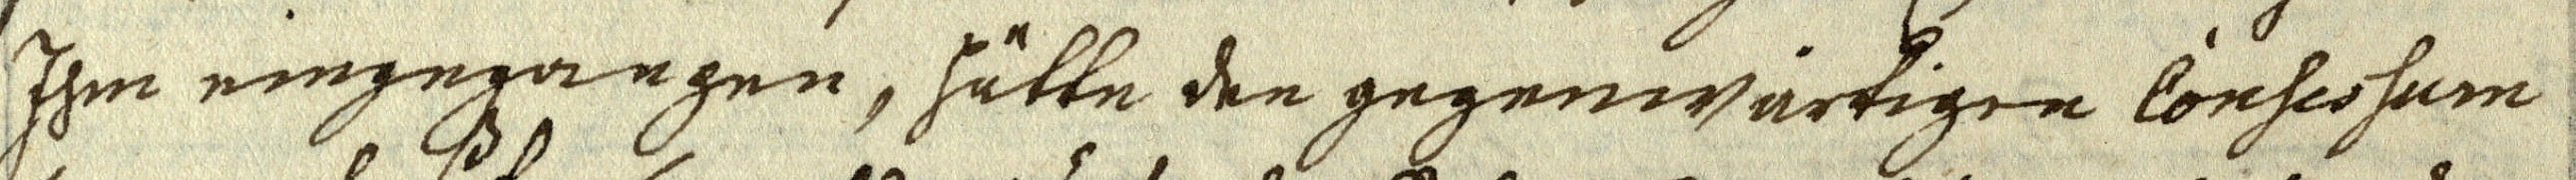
Ihm eingegangen, hätte den gegenwärtigen Consessum
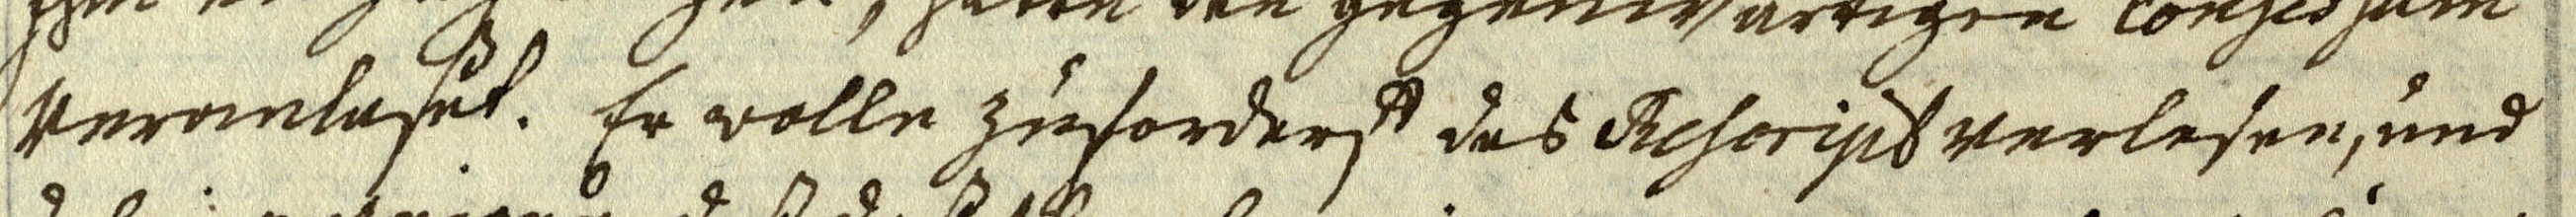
veranlaßet. Er wolle zuforderst das Rescript verlesen, und
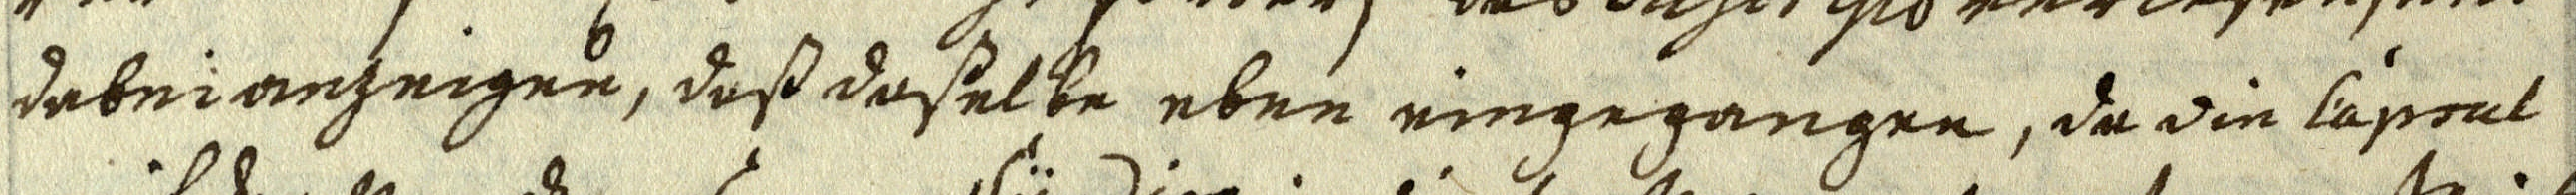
dabei anzeigen, daß daßelbe eben eingegangen, da die Capsul
